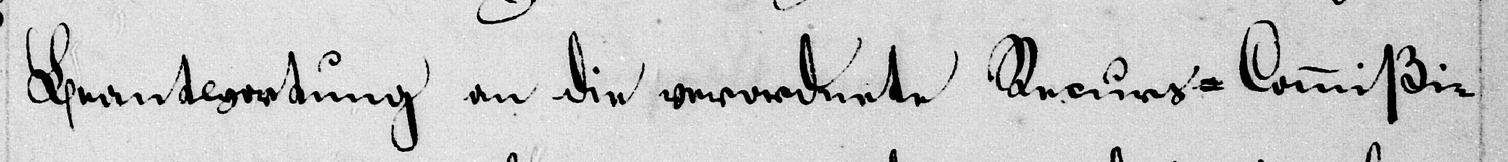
Beantwortung an die verordnete Recurs-Commißio¬
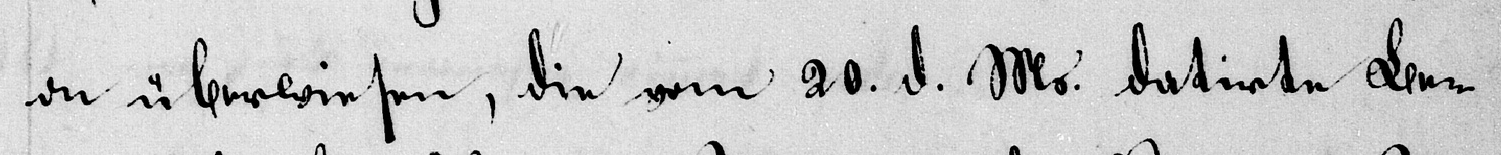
n überwiesen, die vom 20. d. Ms. datirte Be¬
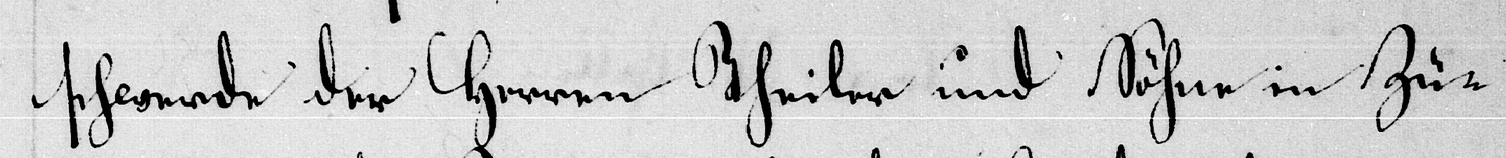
schwerde der Herren Theiler und Söhne in Zü¬
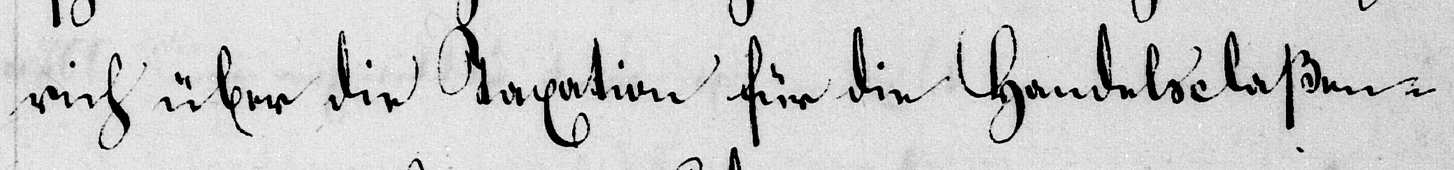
rich über die Taxation für die Handelsclaßen¬
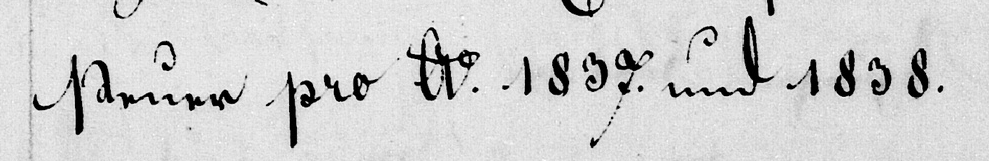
steuer pro Ao. 1837. und 1838.
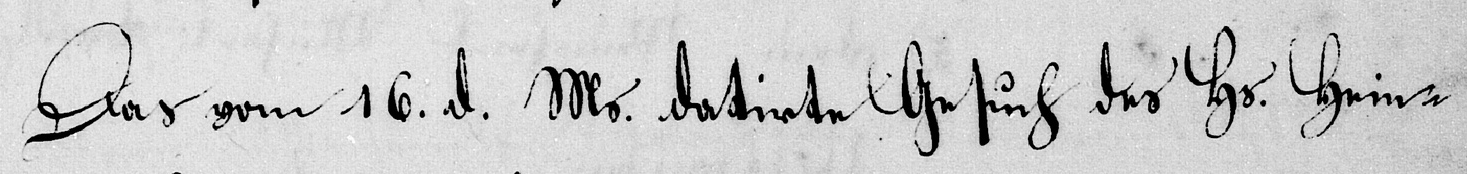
Das vom 16. d. Ms. datirte Gesuch des Hs. Hein¬
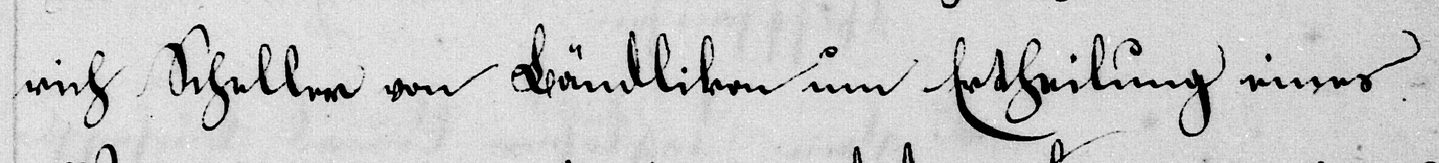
rich Scheller von Bändlikon um Ertheilung eines
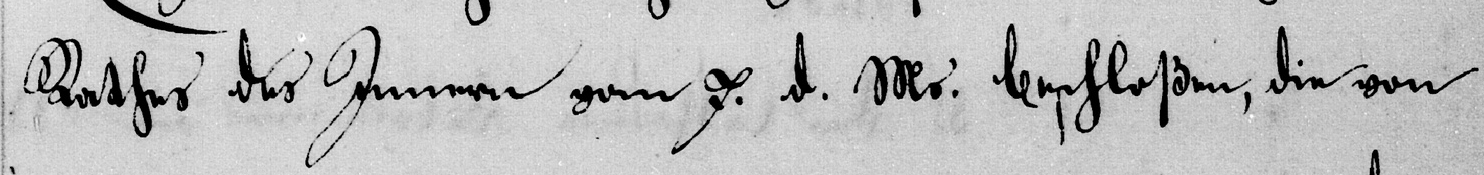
Rathes des Innern vom 7. d. Ms. beschloßen, die von
